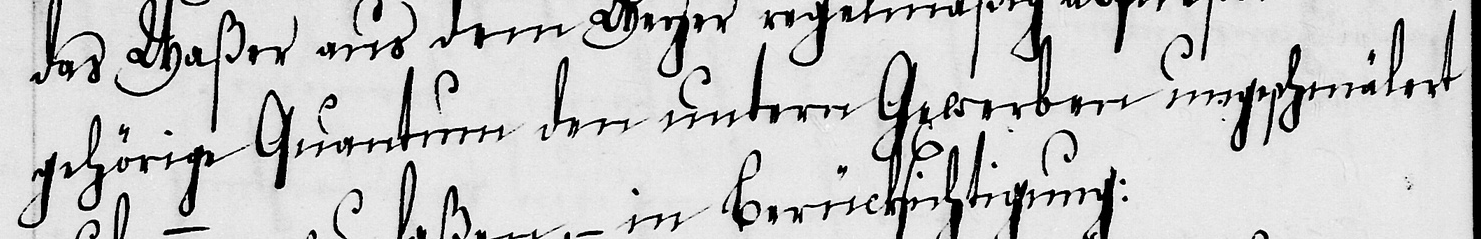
gehörige Quantum den untern Gewerben ungeschmälert
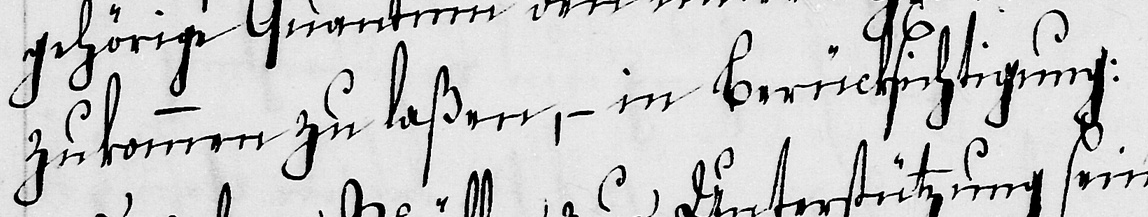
zukommen zu laßen, – in Berücksichtigung:
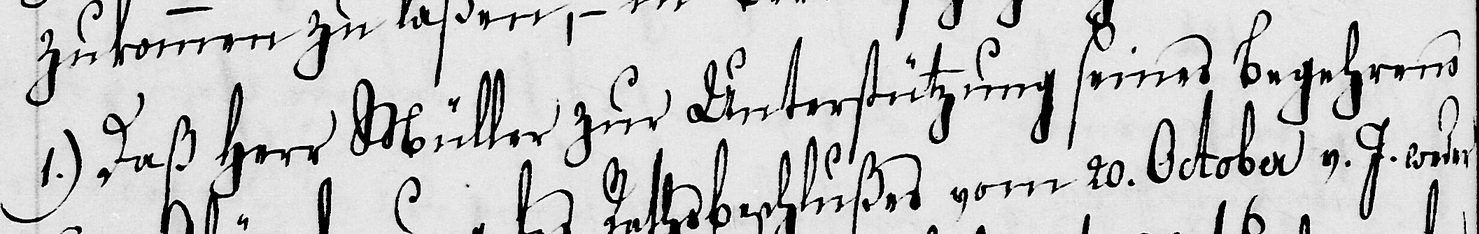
1.) Daß Herr Müller zur Unterstützung seines Begehrens
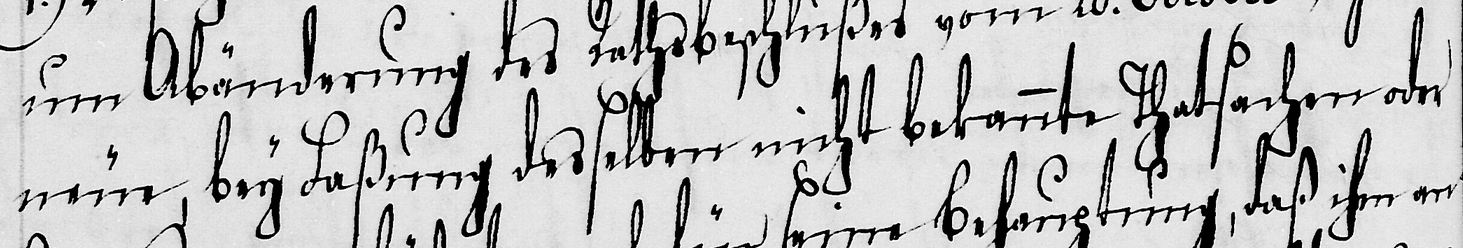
neue, bey Faßung desselben nicht bekannte Thatsachen
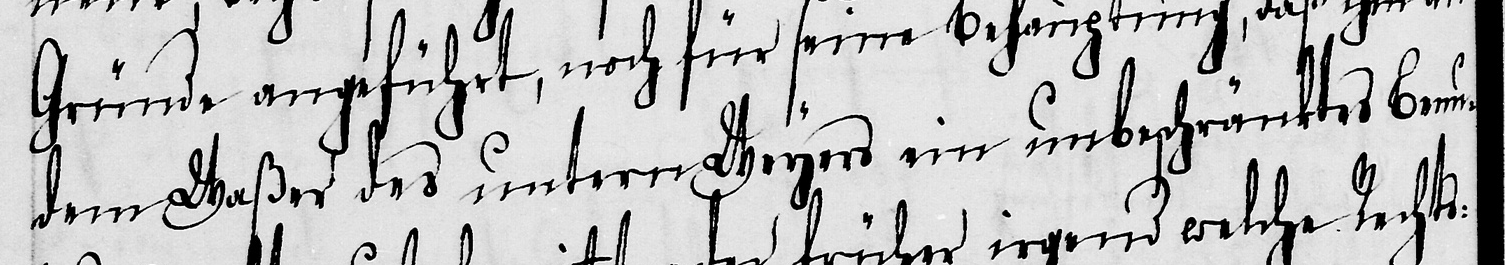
dem Waßer des untern Weyers ein unbeschränktes Benut¬
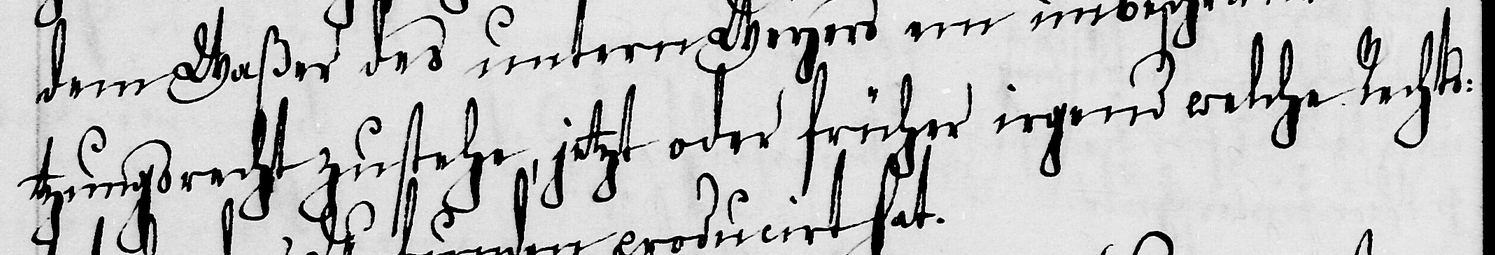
zungsrecht zustehe, jetzt oder früher irgend welche Recht¬
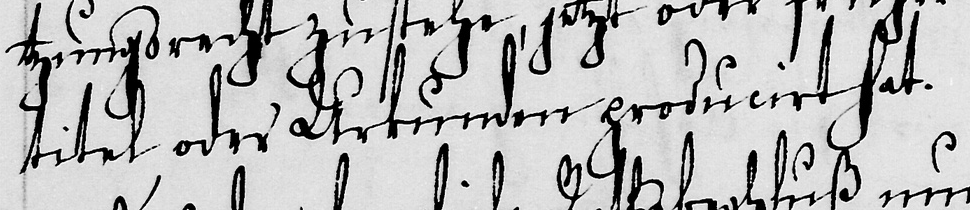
stitel oder Urkunden producirt hat.
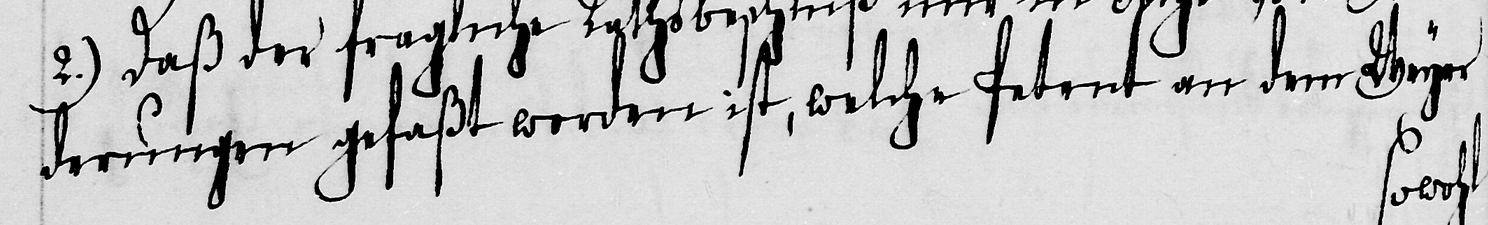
derungen gefaßt worden ist, welche Petent an dem Weyer
